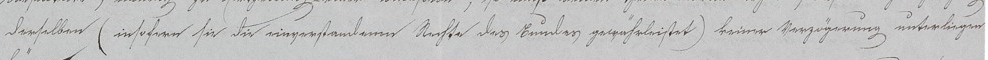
derselben (insofern sie die einverstandenen Rechte des Bundes gewährleistet) keiner Verzögerung unterliegen
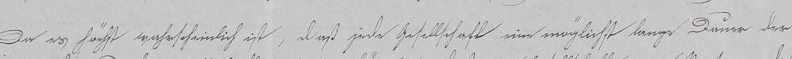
Da es höchst wahrscheinlich ist, daß jede Gesellschaft eine möglichst lange Dauer der
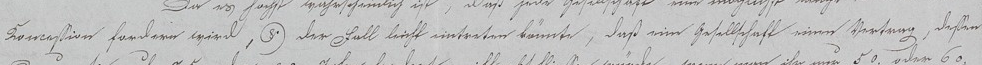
Koncession fordern wird, & der Fall leicht eintreten könnte, daß eine Gesellschaft einen Vertrag, dessen
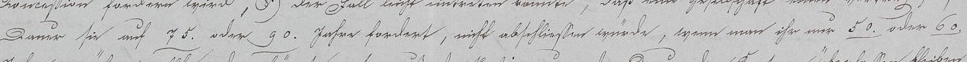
Dauer sie auf 75. oder 90. Jahre fordert, nicht abschliessen würde, wenn man ihr nur 50. oder 60.
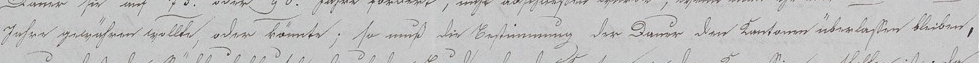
Jahre gewähren wollte, oder könnte; so muß die Bestimmung der Dauer den Kantonen überlassen bleiben,
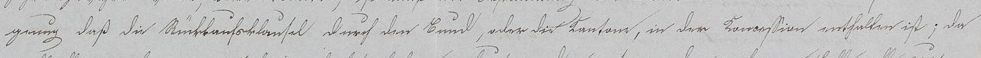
genug daß die Rückkaufsklausel durch den Bund, oder die Kantone, in der Koncession enthalten ist; da
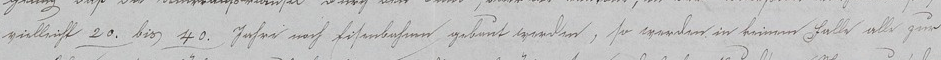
vielleicht 20. bis 40. Jahre noch Eisenbahnen gebaut werden, so werden in keinem Falle alle zur
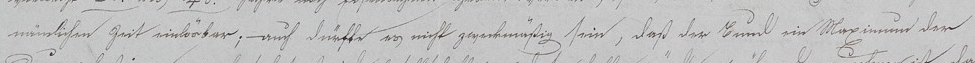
nämlichen Zeit einlösbar; auch dürfte es nicht zweckmäßig sein, daß der Bund ein Maximum der
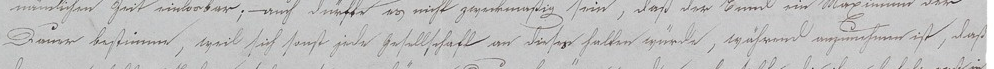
Dauer bestimme, weil sich sonst jede Gesellschaft an dieses halten würde, während anzunehmen ist, daß
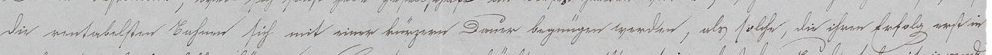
die rentabelsten Bahnen sich mit einer kürzern Dauer begnügen werden, als solche, die ihren Erfolg erst in
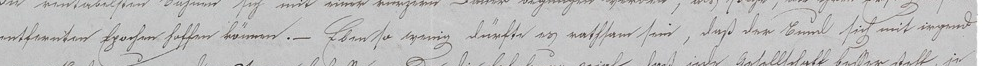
entfernten Epochen hoffen können. – Eben so wenig dürfte es rathsam sein, daß der Bund sich mit irgend
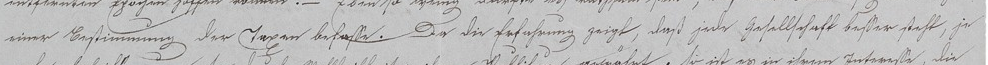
einer Bestimmung der Taxen befasse. Da die Erfahrung zeigt, daß jede Gesellschaft besser steht, je
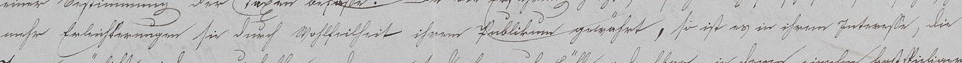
mehr Erleichterungen sie durch Wohlfeilheit ihrem Publikum gewährt, so ist es in ihrem Interesse, die
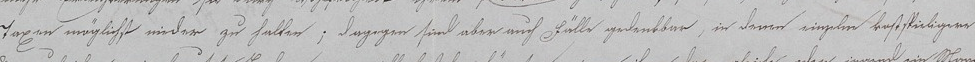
Taxen möglichst nieder zu halten; dagegen sind aber auch Fälle gedenkbar, in denen einzelne kostspieligere
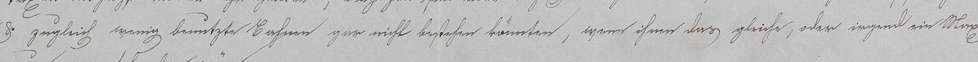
& zugleich wenig benutzte Bahnen gar nicht bestehen könnten, wenn ihnen das gleiche, oder irgend ein Maxi-
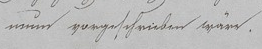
mum vorgeschrieben wäre.
